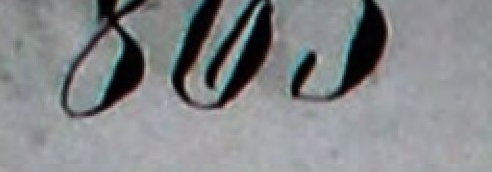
865
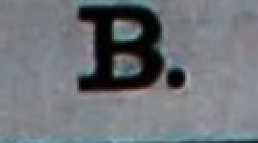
B.
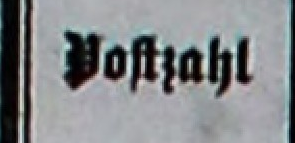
Postzahl
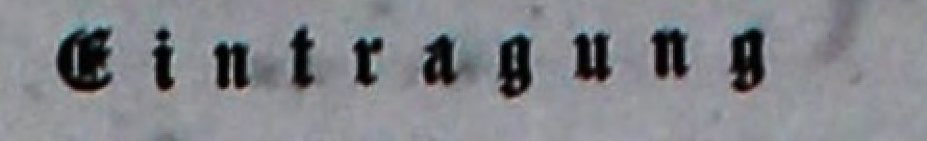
Eintragung
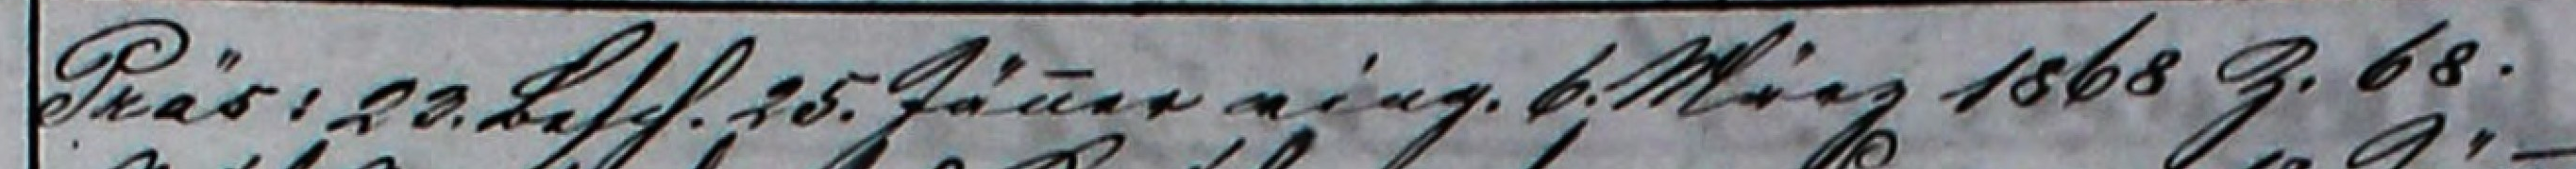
Präs: 23. Besch. 25. Jänner eing. 6. März 1868 Z. 68.
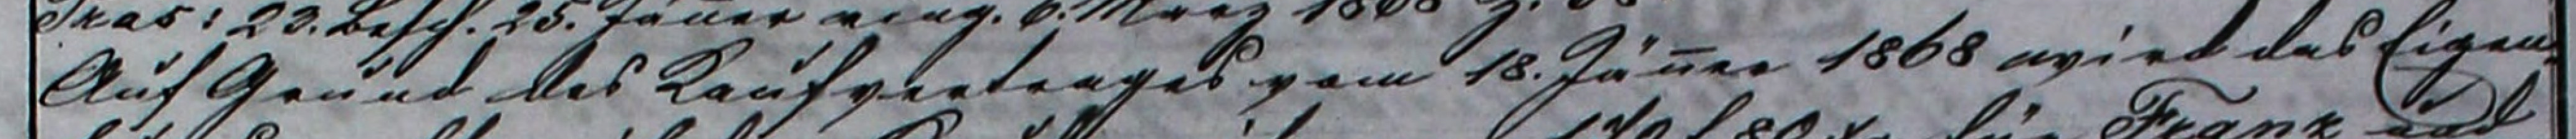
Auf Grund des Kaufvertrages vom 18. Jänner 1868 wird das Eigen„
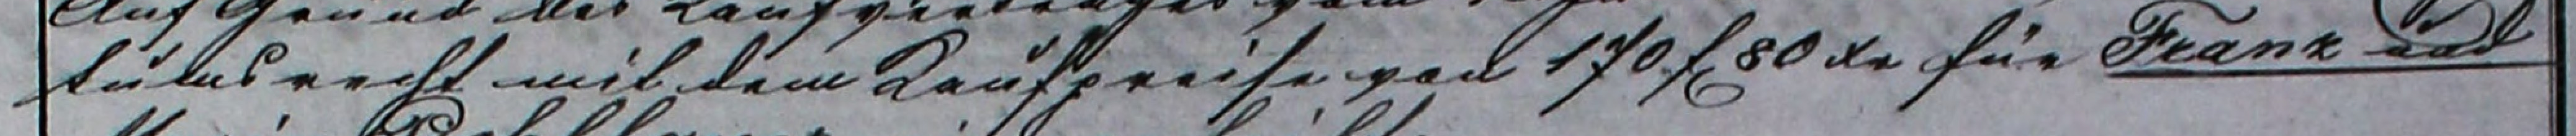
tumsrecht mit dem Kaufpreise von 170 f. 80 ?? für Franz und
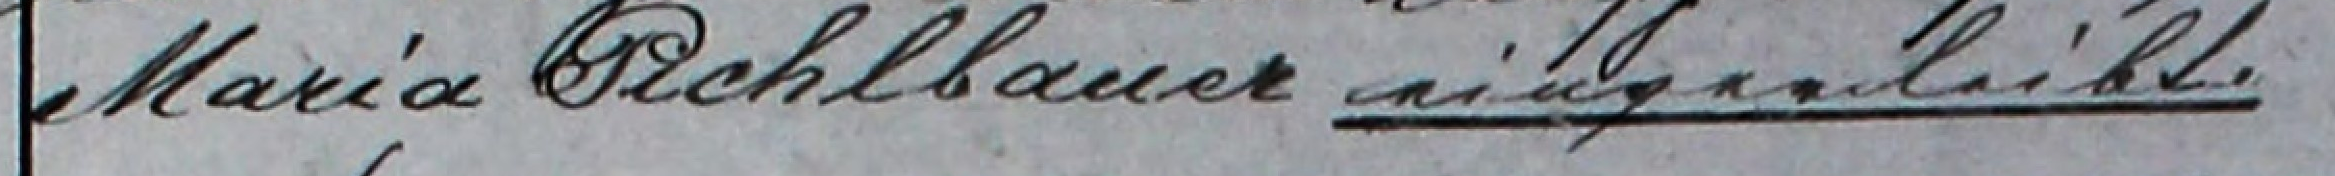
Maria Pichlbauer einverleibt.
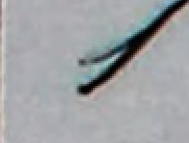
1
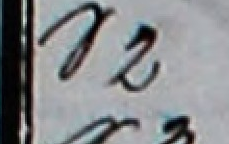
S 2
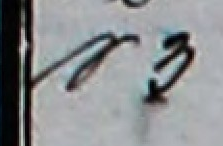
S 3
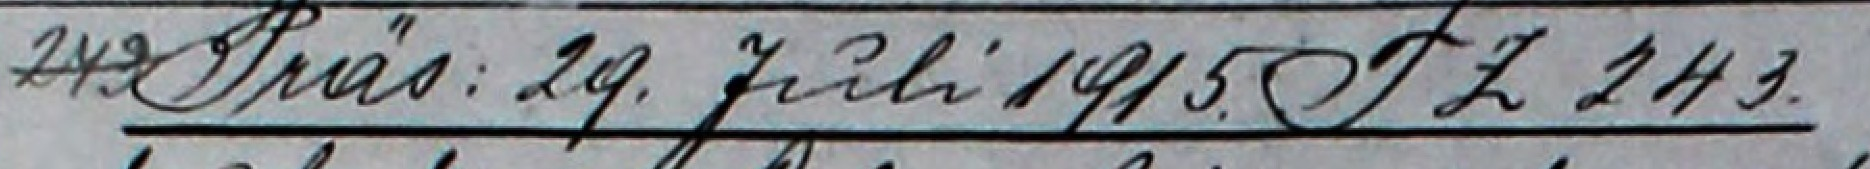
243 Präs: 29. Juli 1915. T Z 243.
